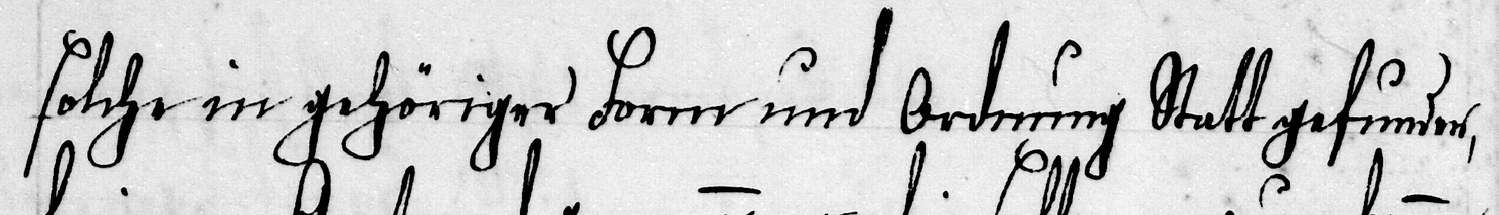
solche in gehöriger Form und Ordnung Statt gefunde¬
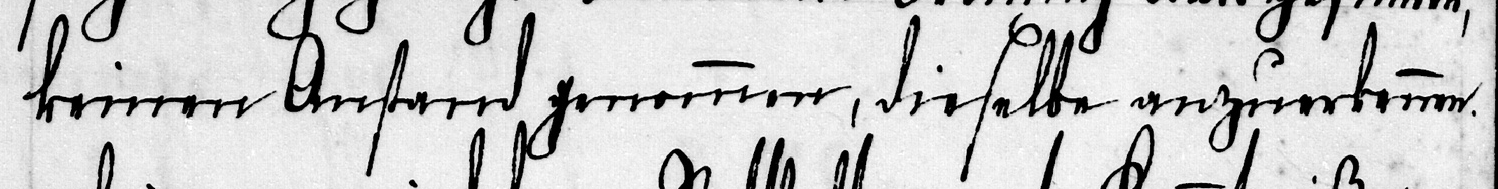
keinen Anstand genommen, dieselbe anzuerkenne¬
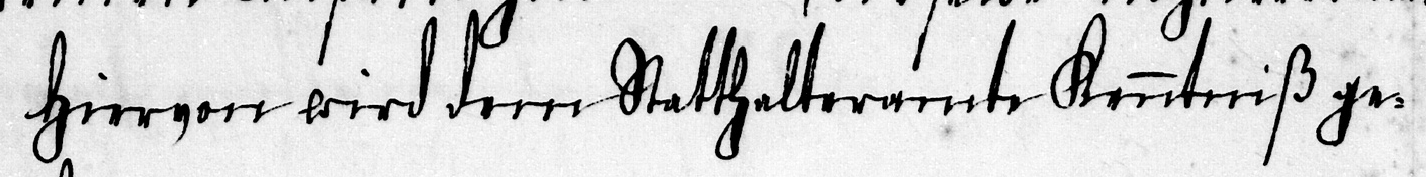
Hiervon wird dem Statthalteramte Kenntniß ge¬
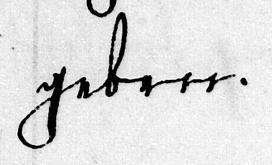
geben.
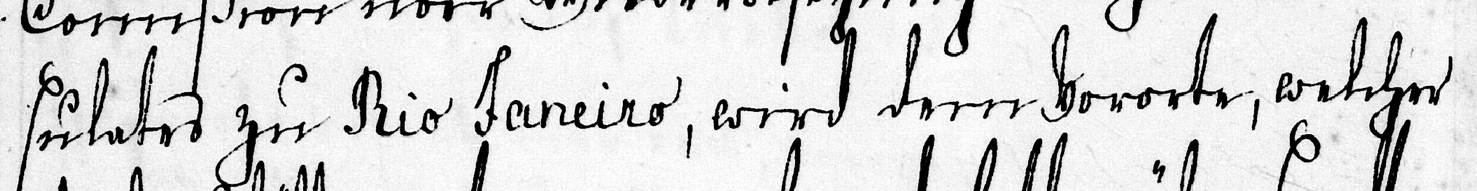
sulates zu Rio Janeiro, wird dem Vororte, welcher
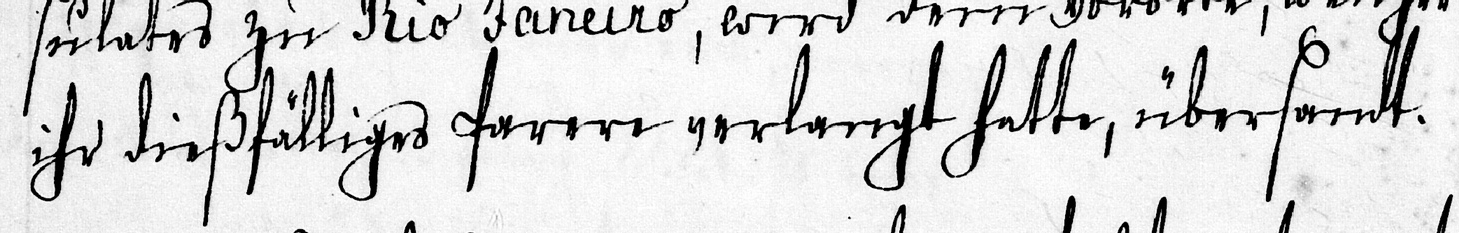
ihr dießfälliges Parere verlangt hatte, übersandt.
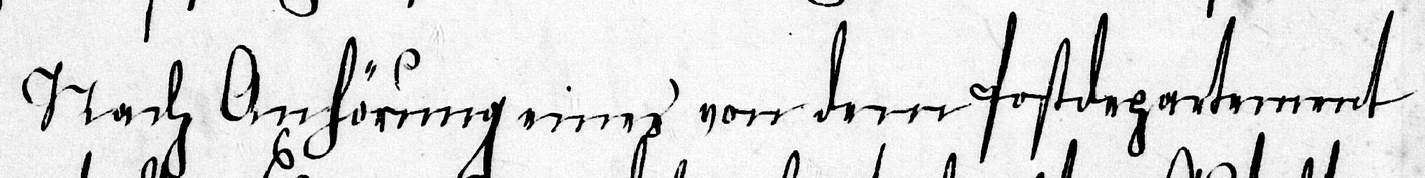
Nach Anhörung eines von dem Postdepartement
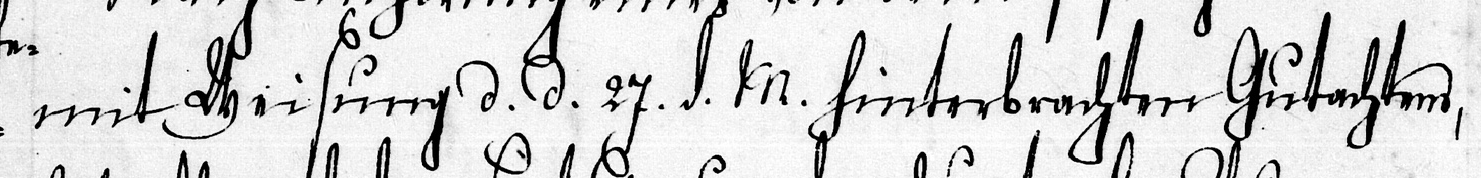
mit Weisung d. d. 27. d. M. hinterbrachten Gutachten¬
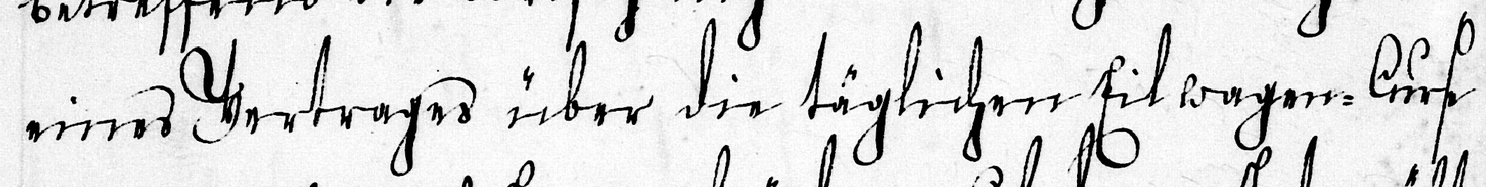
eines Vertrages über die täglichen Eilwagen-Curse
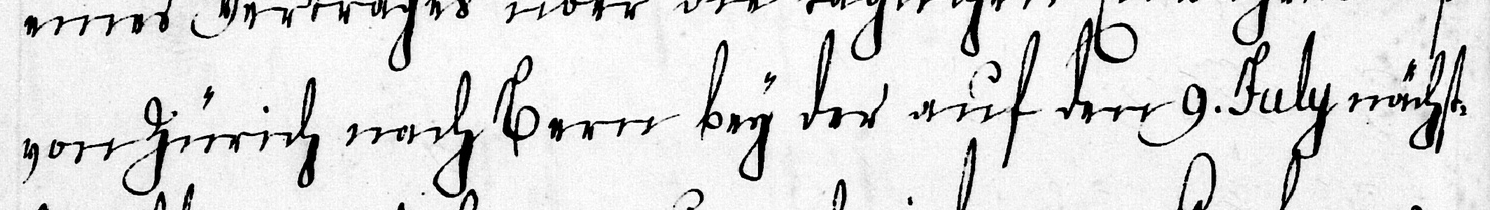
von Zürich nach Bern bey der auf den 9. July nächs¬
